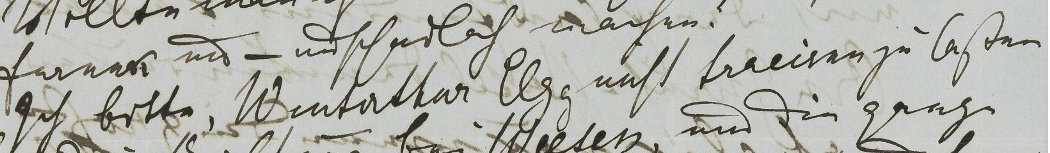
Ich bitte, WinterthurElgg nicht traciren zu laßen
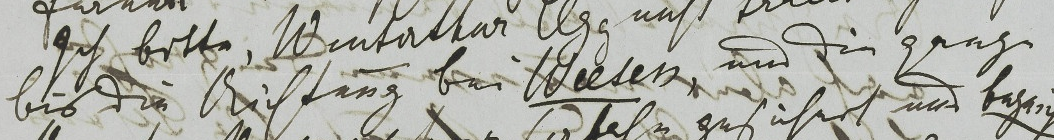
bis die Richtung bei Weesen, und die ganze
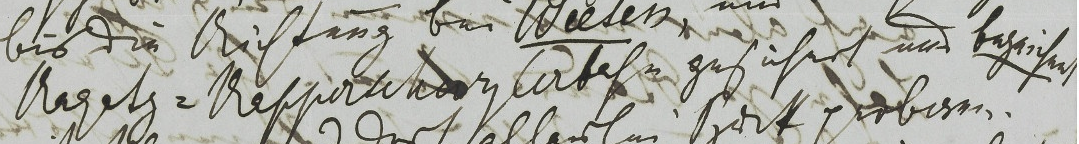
Ragatz– Rapperschwylerbahn gesichert und bezeichnet
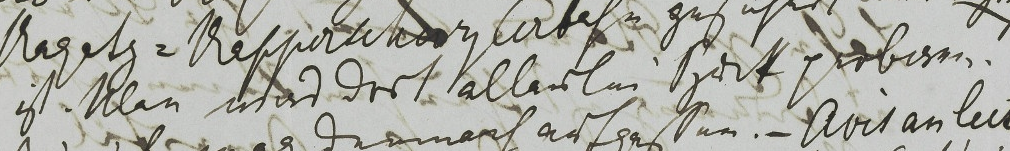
ist. Man wird dort allerlei Spuck probiren.
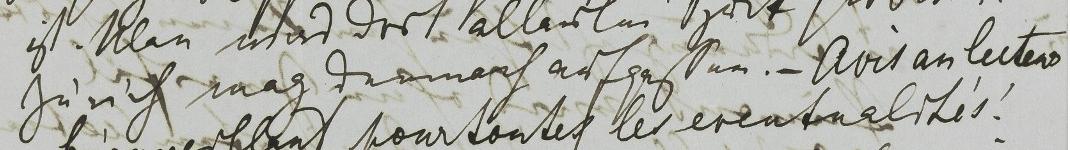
Zürich mag demnach aufpassen. – Avis au lecteur
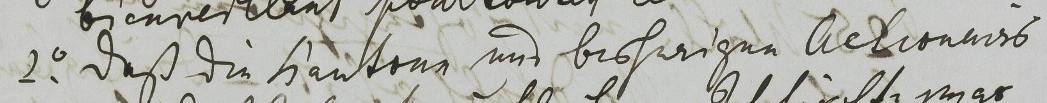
2o Daß die Kantone und bisherigen Actionairs
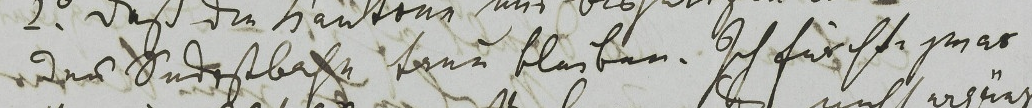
der Südostbahn treu bleiben. Ich fürchte zwar
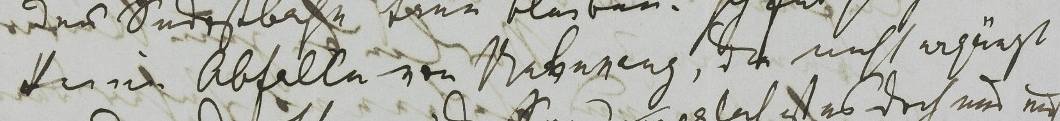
keine Abfälle von Relevanz, die nicht ergänzt
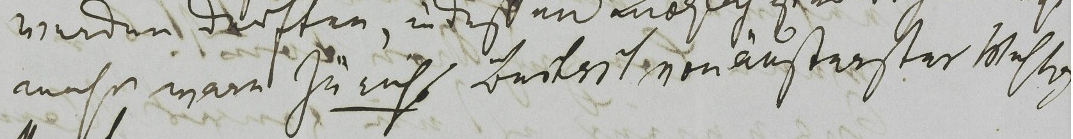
mehr wäre Zürichs Beitrit von äußerster Wichtig-
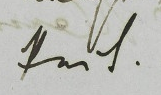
keit.
